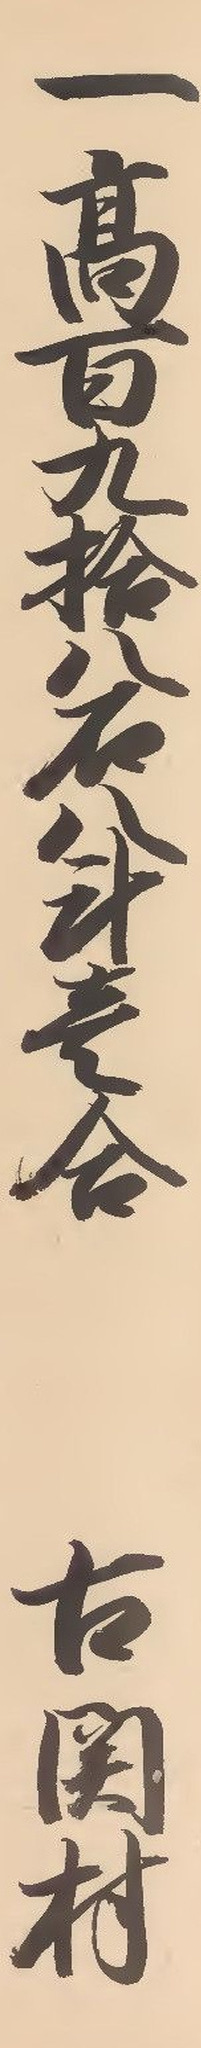一高百九拾八石八斗壱合古関村
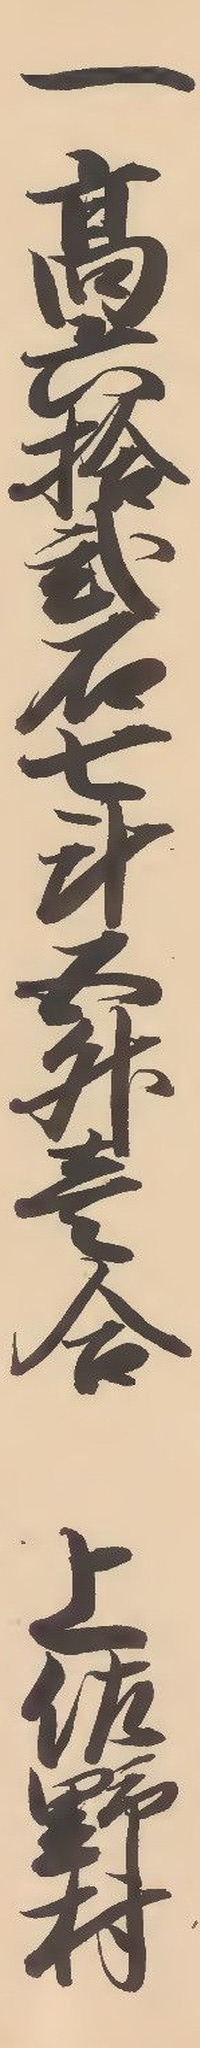一高六拾弐石七斗五升壱合上佐野村
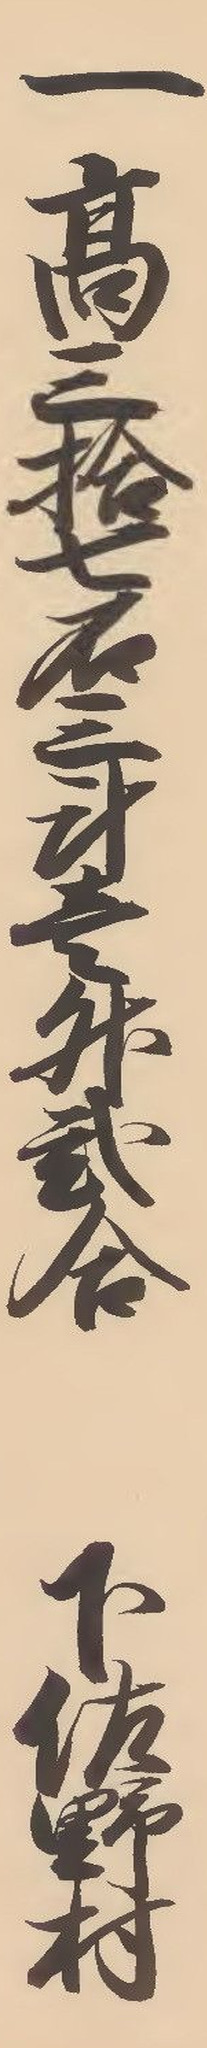一高三拾七石三斗壱升弐合下佐野村

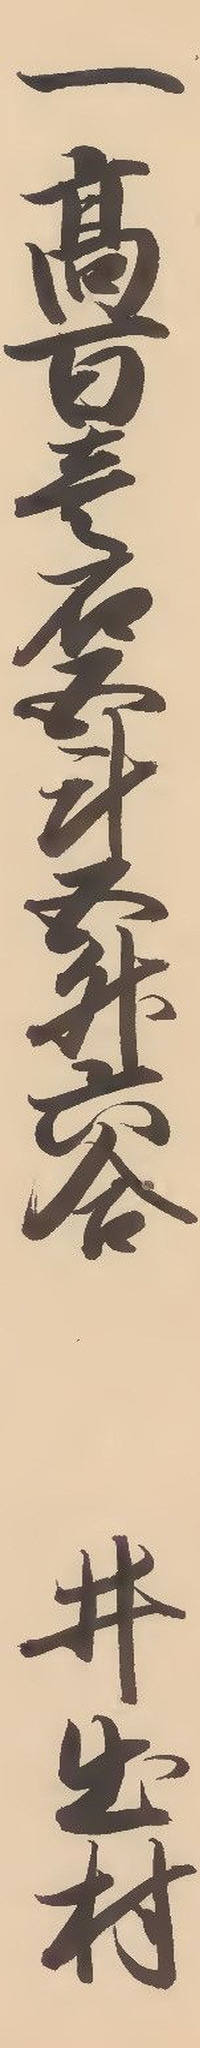一高百壱石五斗五升六合井出村
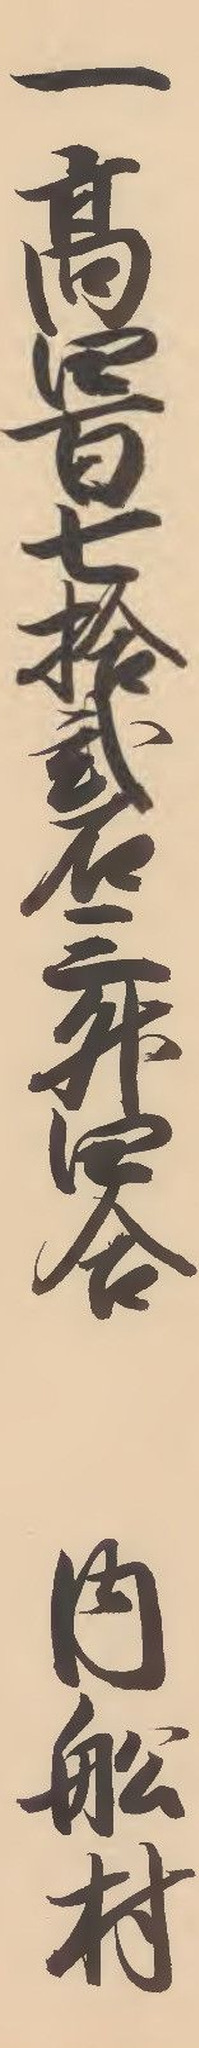一高四百七拾弐石三升四合内船村
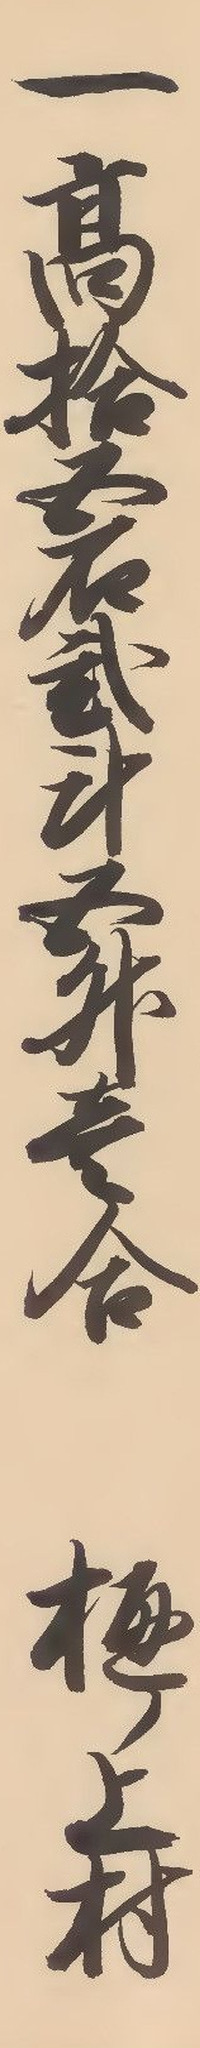一高拾五石弐斗五升壱合樋ノ上村
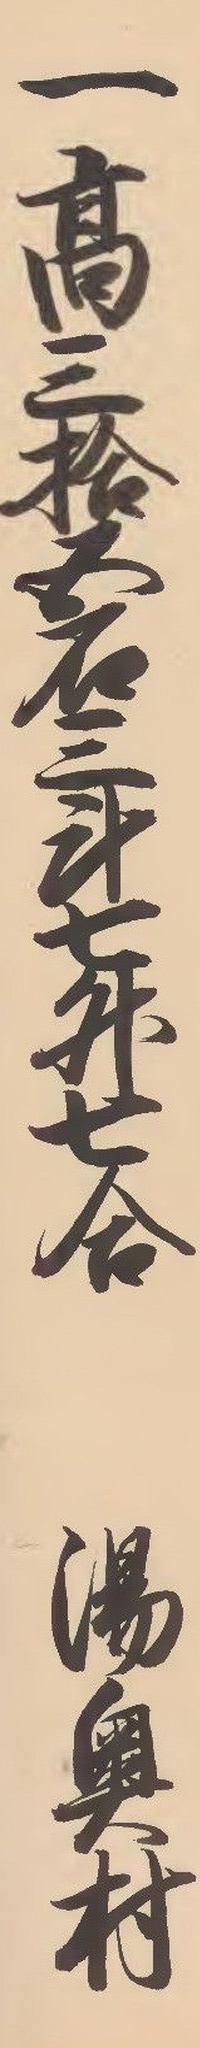一高三拾五石三斗七升七合湯奥村
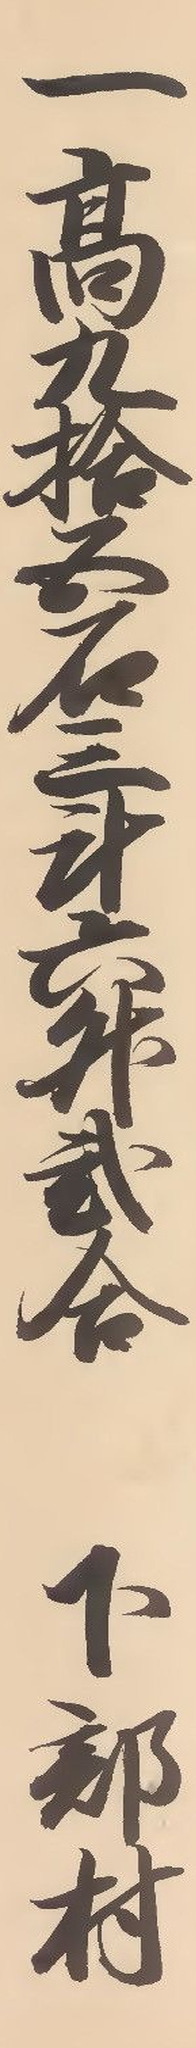一高九拾五石三斗六升弐合下部村
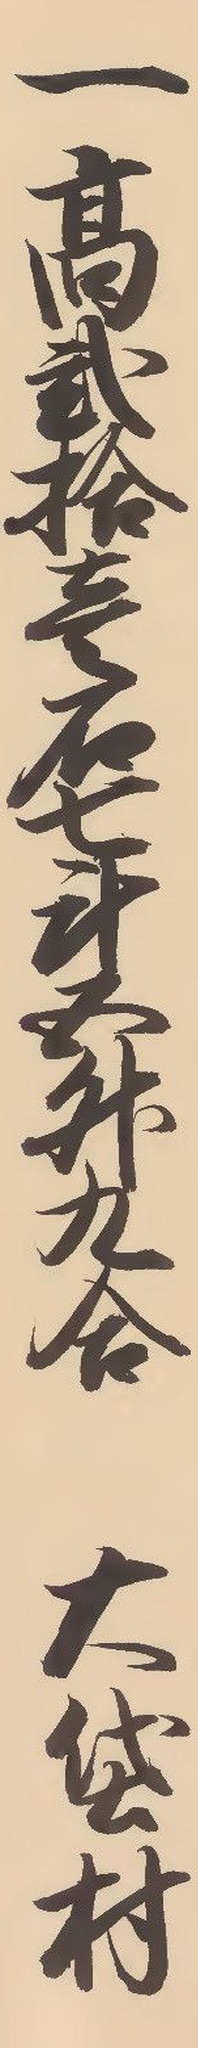一高弐拾壱石七斗五升九合大垈村
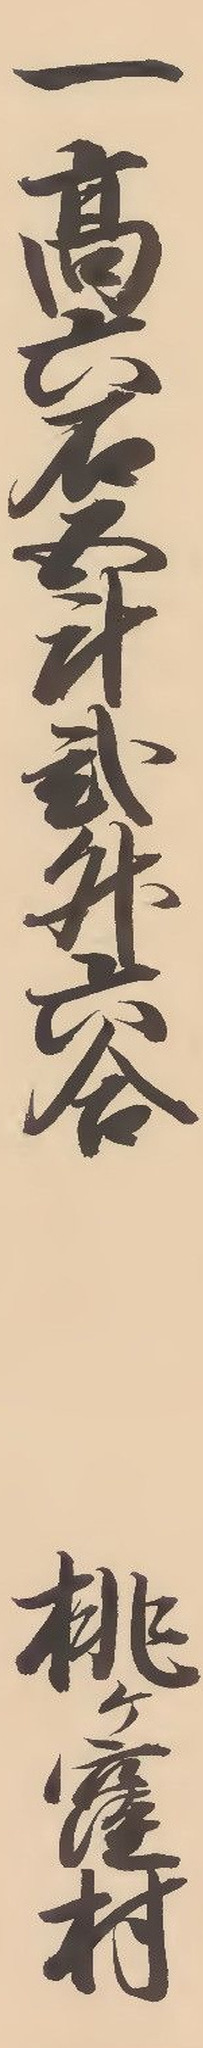一高六石五斗弐升六合桃ヶ窪村
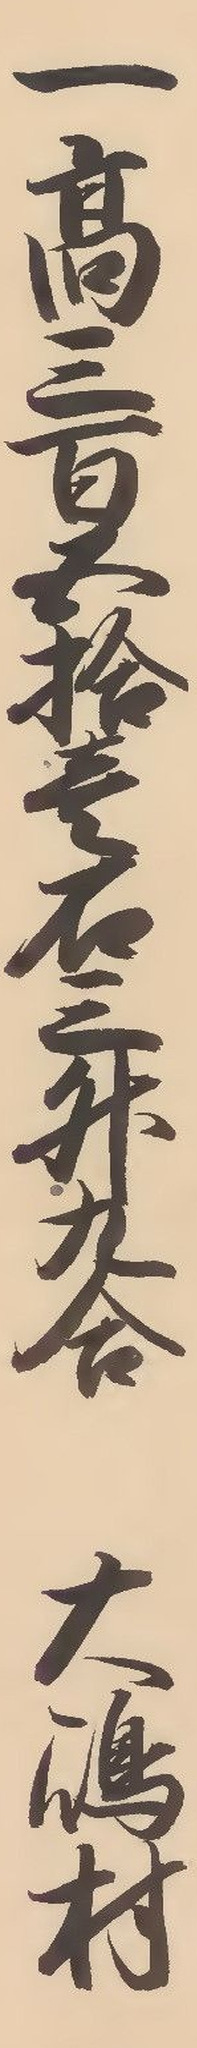一高三百五拾壱石三升九合大島村

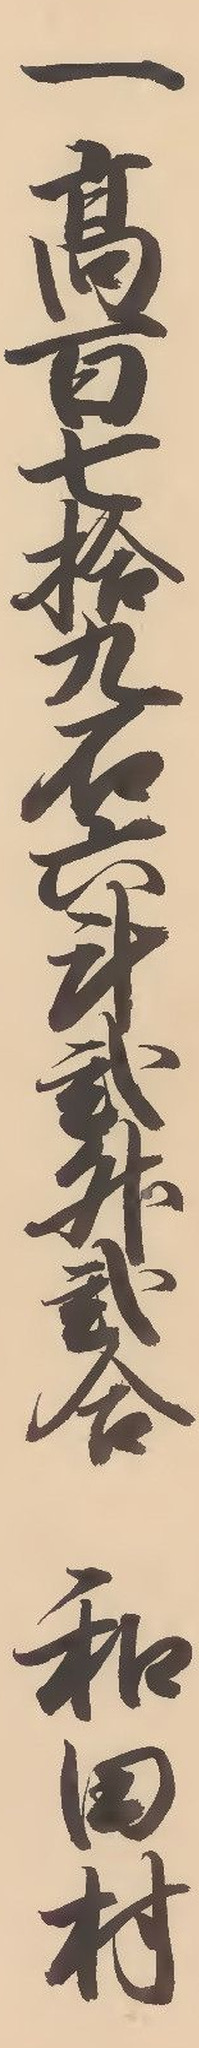一高百七拾九石六斗弐升弐合和田村
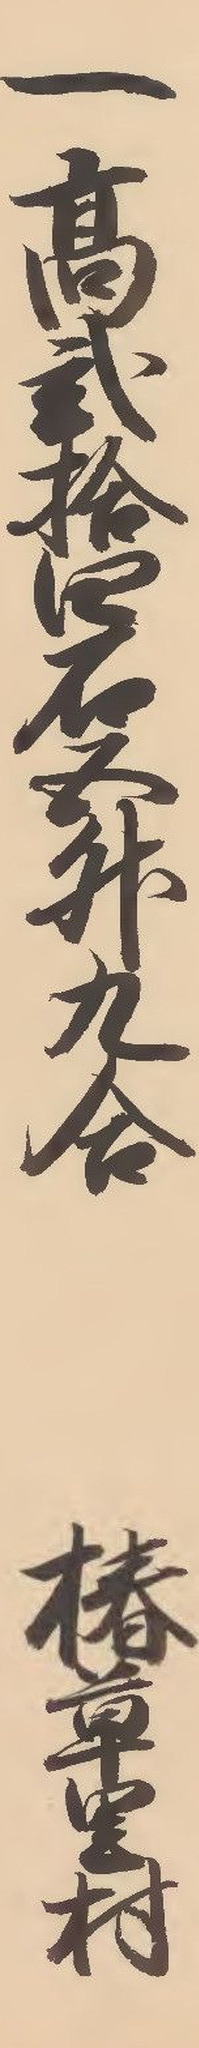一高弐拾四石五升九合椿草里村
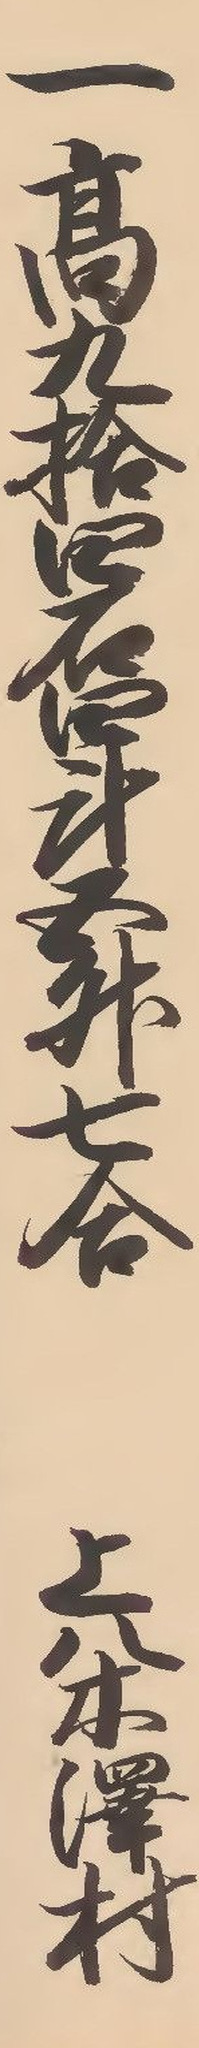一高九拾四石四斗五升七合上八木沢村
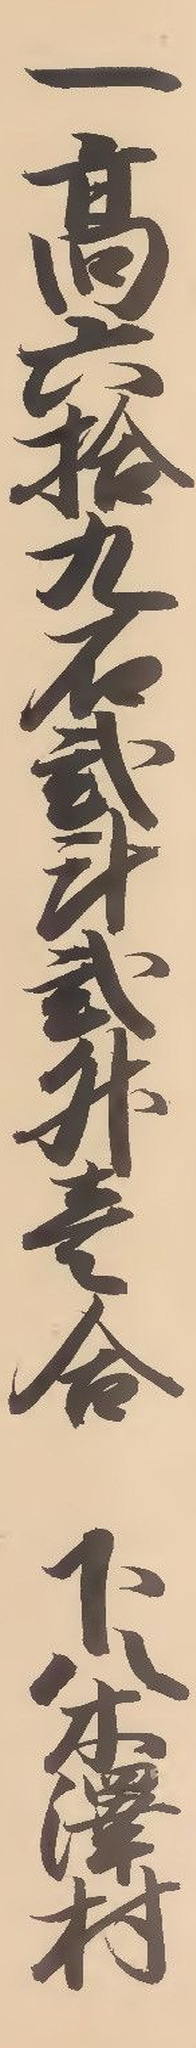一高六拾九石弐斗弐升壱合下八木沢村
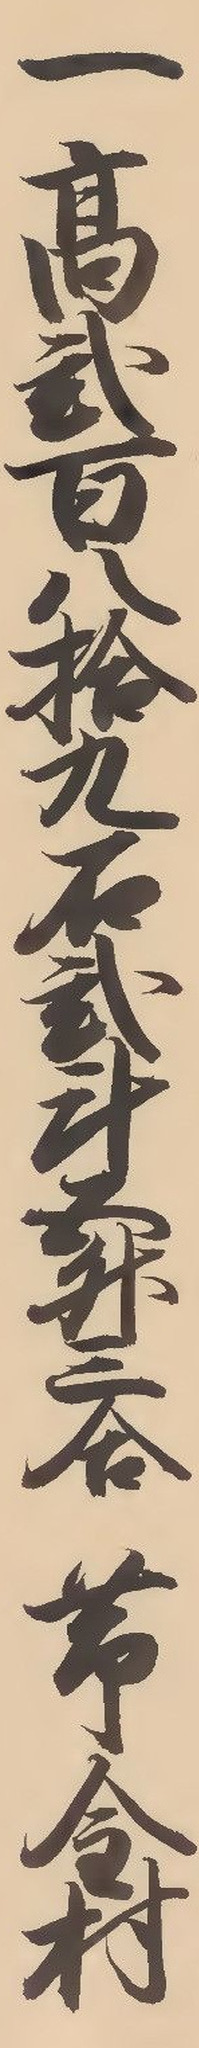一高弐百八拾九石弐斗五升三合帯金村
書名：甲斐国郷帳
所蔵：国立公文書館 National Archives of Japan
